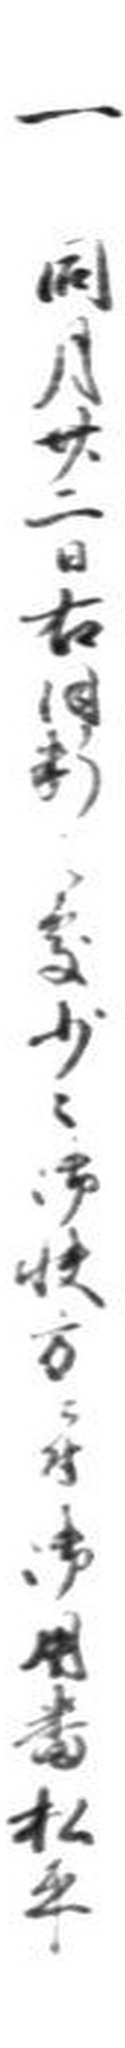一同月廿二日右同断之処少々御快方ニ付御用番松平
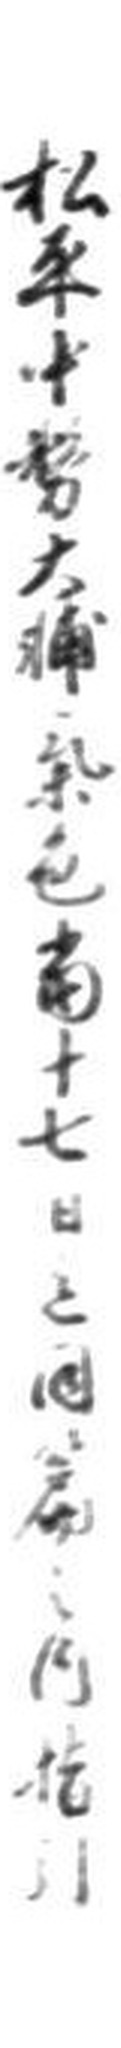松平中務大輔気色当十七日迄同篇之内指引
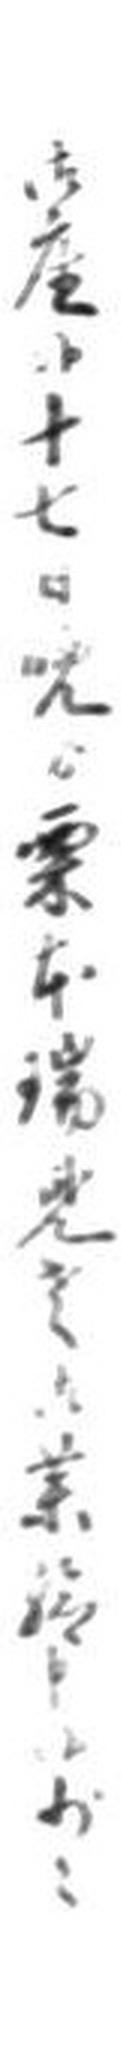御座候十七日晩ゟ栗本瑞見老御薬給申候少々
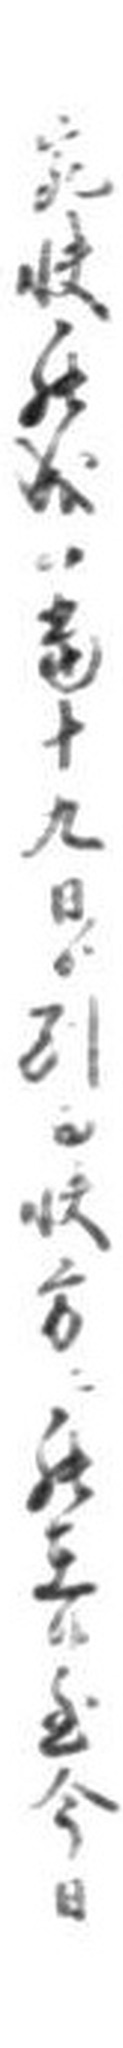宛快罷成候当十九日ゟ別而快方ニ罷在候至今日
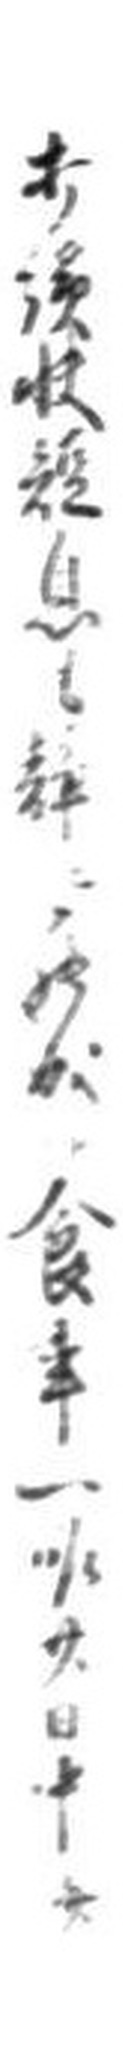打続快短息も静ニ罷成候食事一昨廿日中并
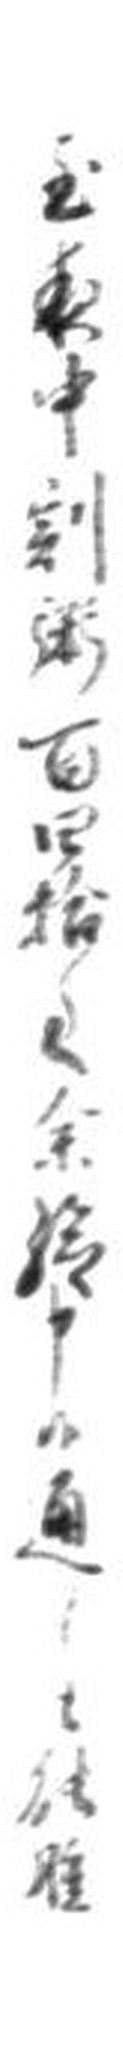至夜中割粥百四拾匁余給申候通しも能腫
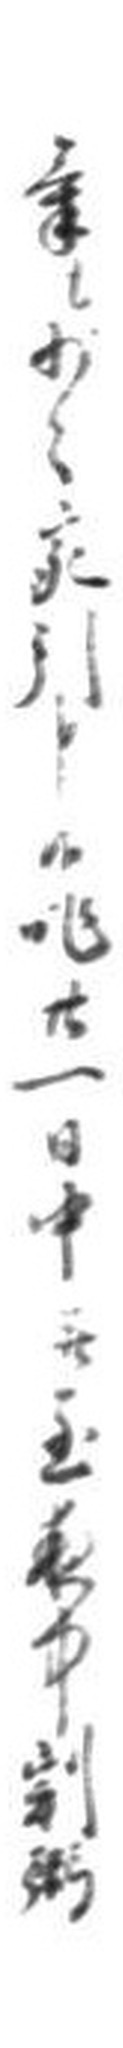気も少々宛引申候昨廿一日中并至夜中割粥
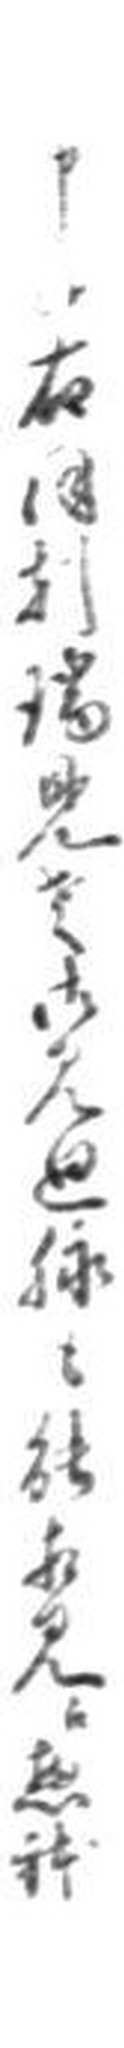申候右同刻瑞見老御見廻脈も能相見江惣体

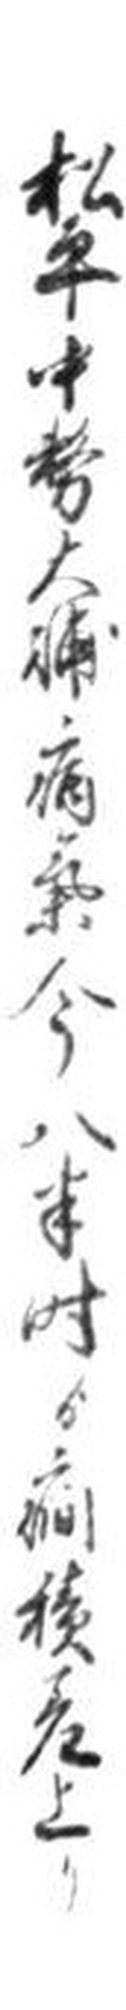松平中務大輔病気今八半時ゟ癇積差上り
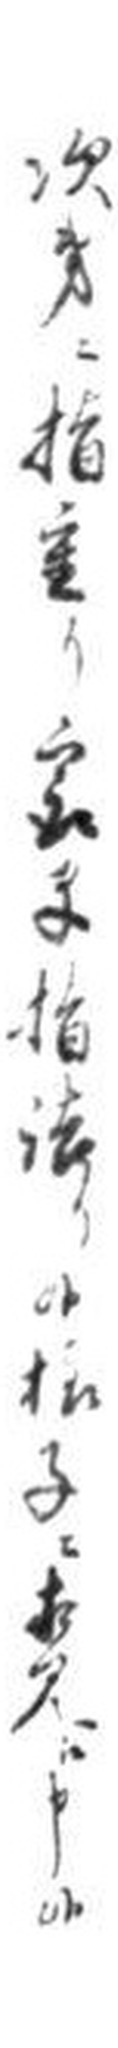次第ニ指重り最早指詰り候様子ニ相見江申候
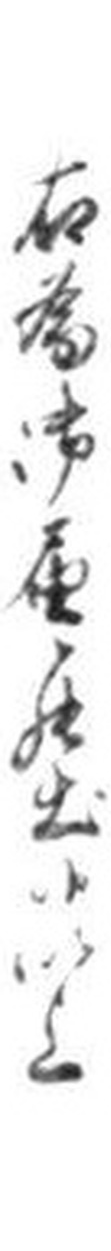右為御届罷出候以上
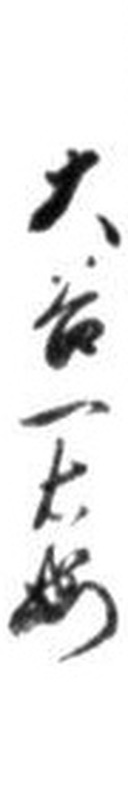大谷一右衛門
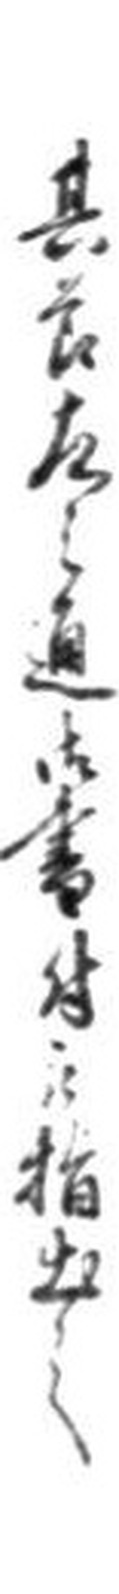其節左之通御書付被指出之
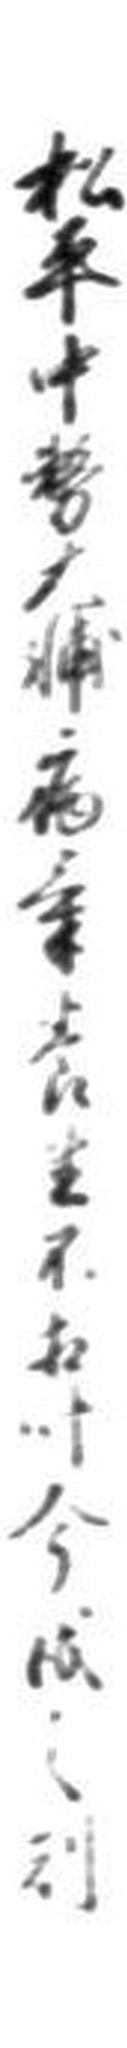松平中務大輔病気養生不相叶今戌之刻
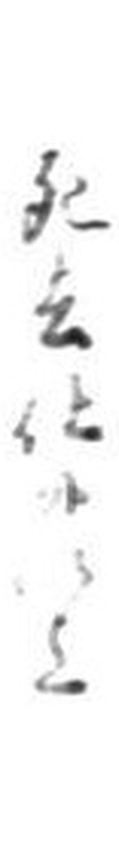死去仕候以上
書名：家譜 三十六 宗昌公 従享保八年到同九年
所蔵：福井県文書館 Fukui Prefectural Archives
